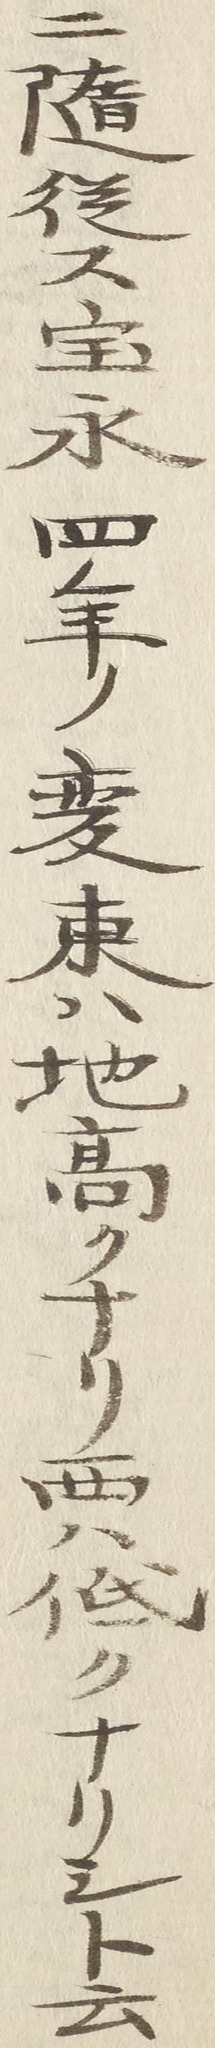ニ随従ス宝永四年ノ変東ハ地高クナリ西ハ低クナリシト云
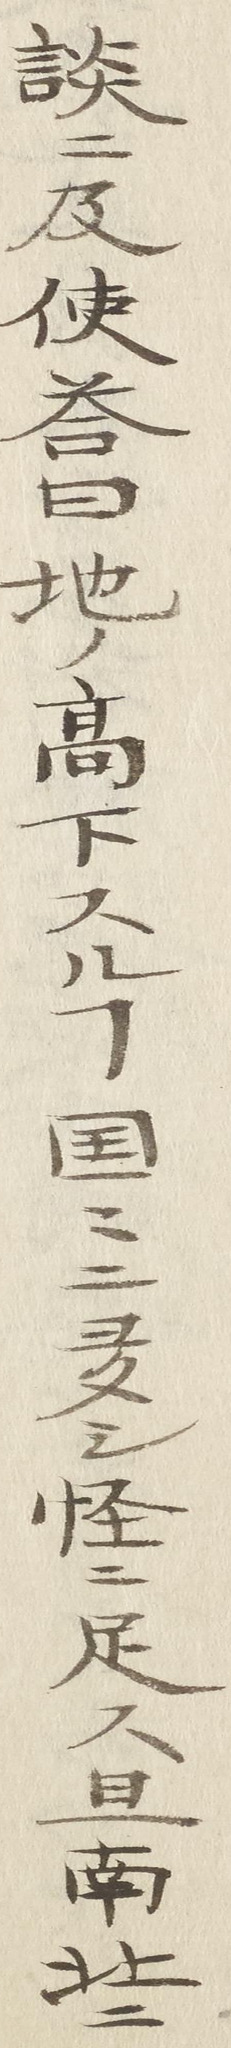談ニ及使答曰地ノ高下スルコト国々ニ多シ怪ニ足ス且南北ニ
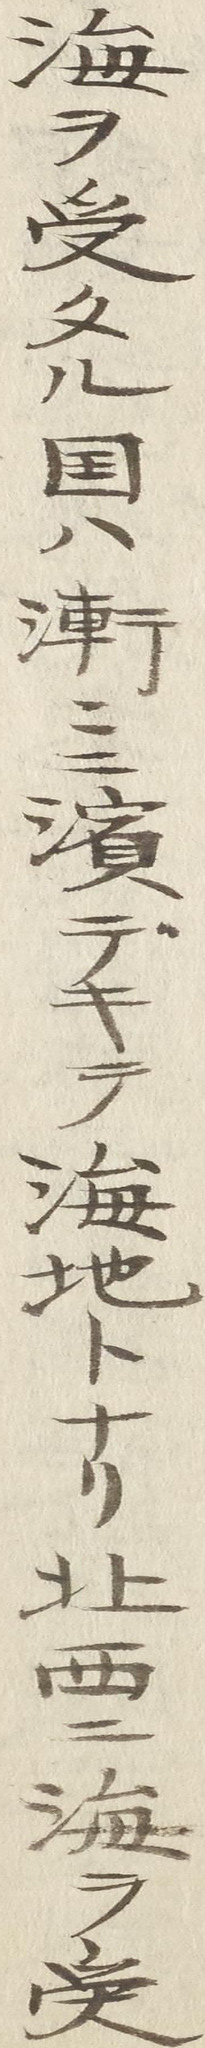海ヲ受タル国ハ漸々ニ濵デキテ海地トナリ北西ニ海ヲ受
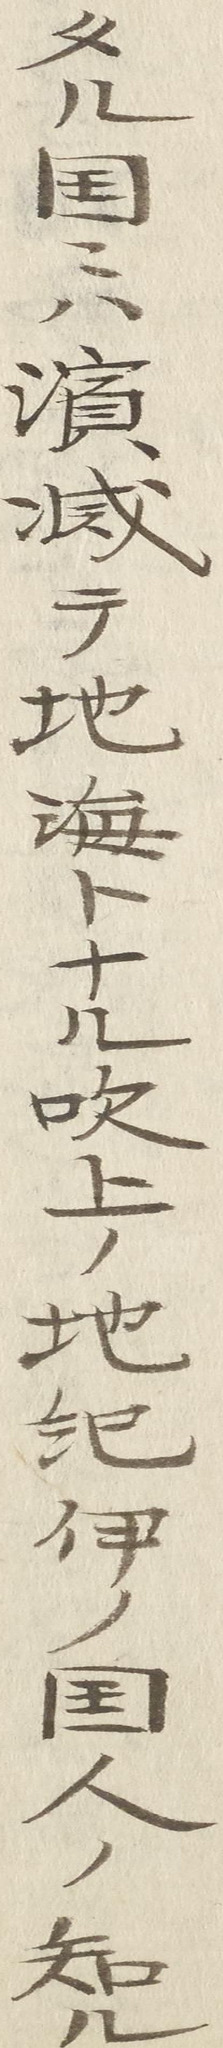タル国々ハ濱滅テ地海トナル吹上ノ地紀伊ノ国人ノ知ル
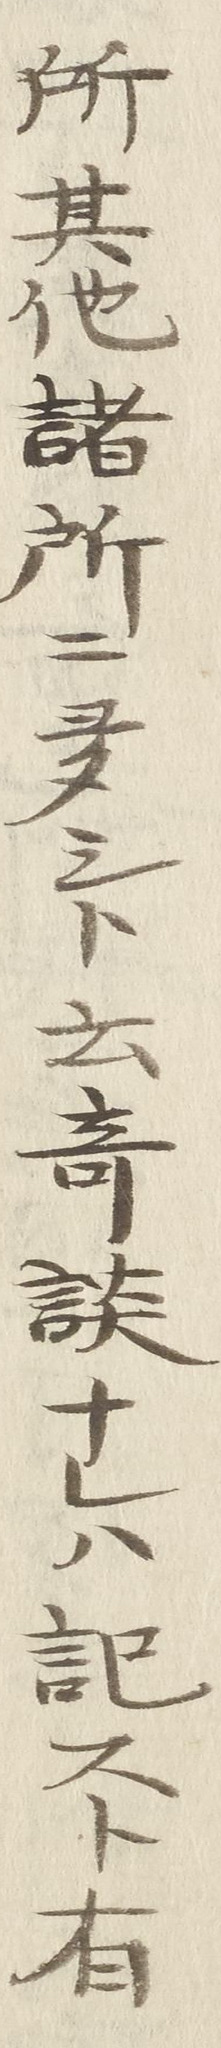所其他諸所ニ多シト云奇談ナレハ記スト有
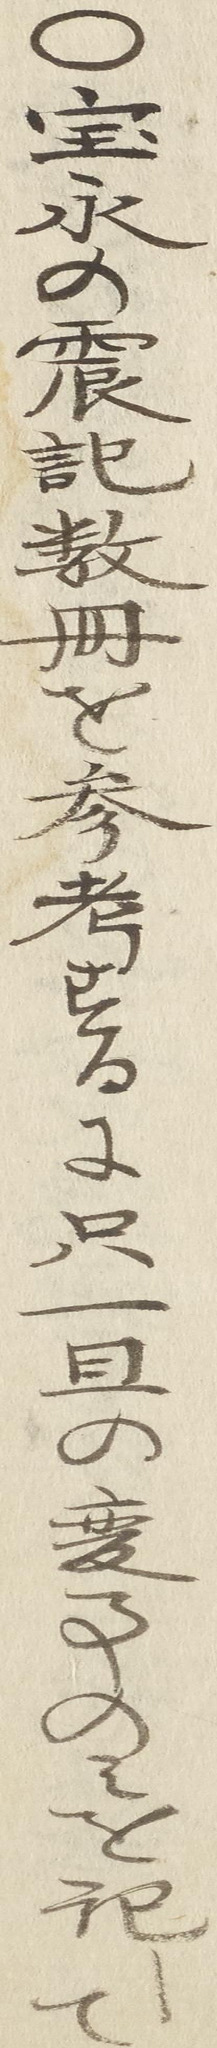○宝永の震記数冊を参考するに只一旦の変事のミを記して

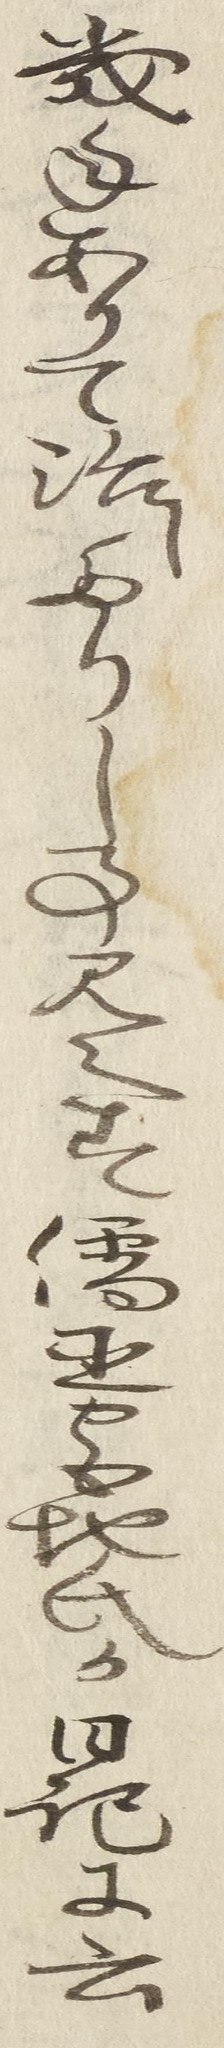幾年ありて治したりし事見えす儒臣宮地氏か日記に云
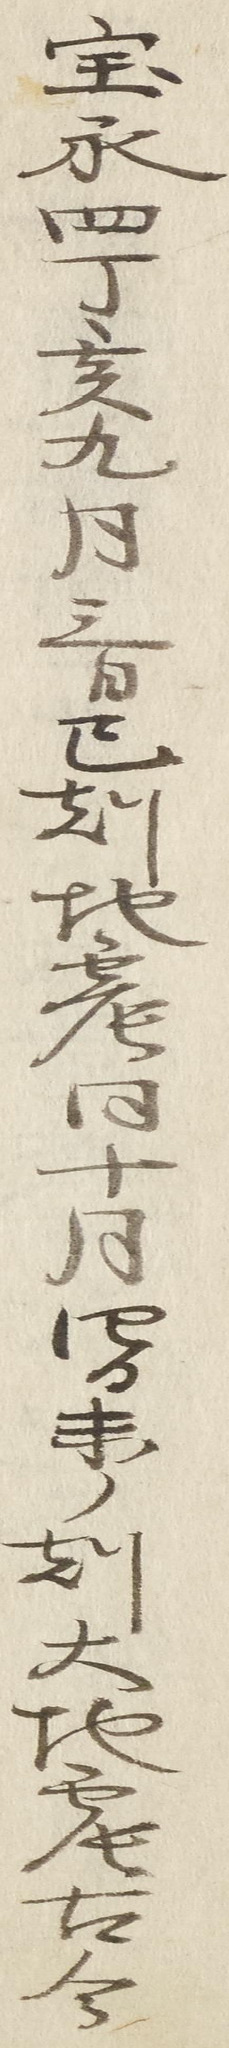宝永四丁亥九月三日巳刻地震同十月四日未の刻大地震古今とも
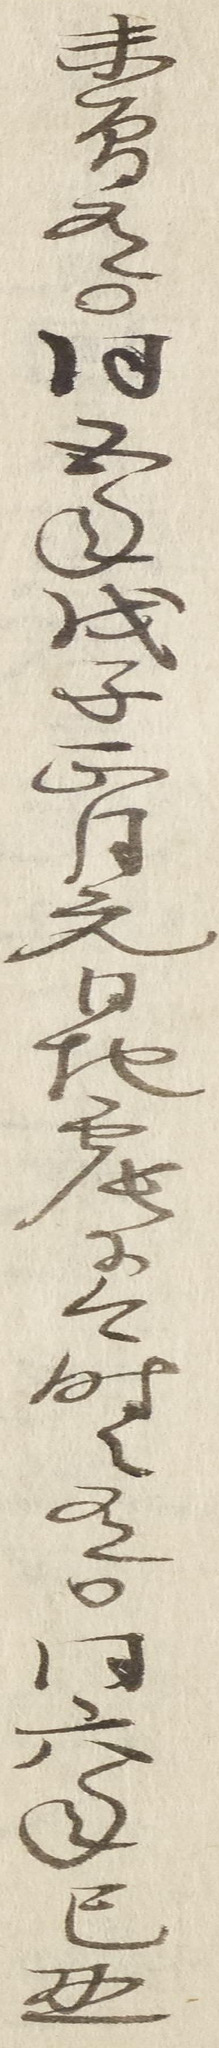未曽有〇同五年戊子正月元旦地震に今時々有〇同六年己丑
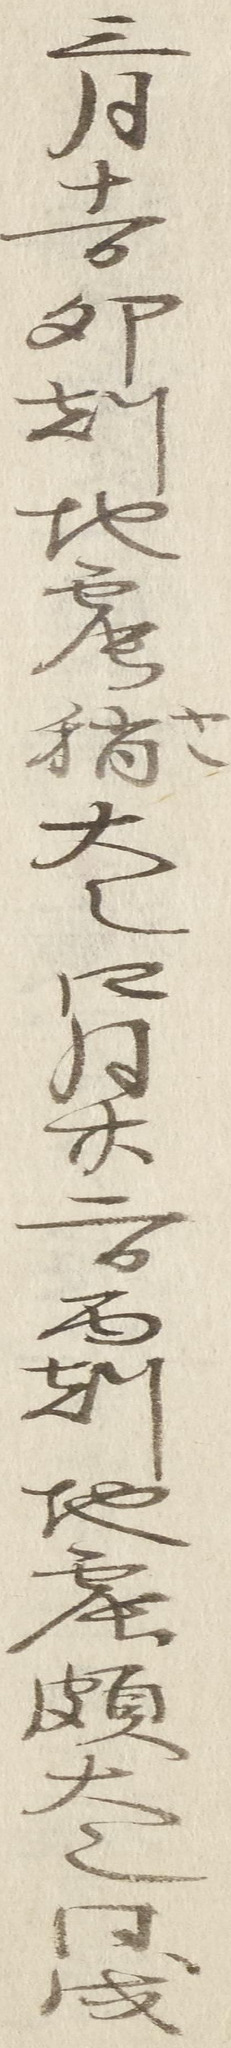三月十一日卯刻地震稍大也四月廿二日酉刻地震頗大也同戌
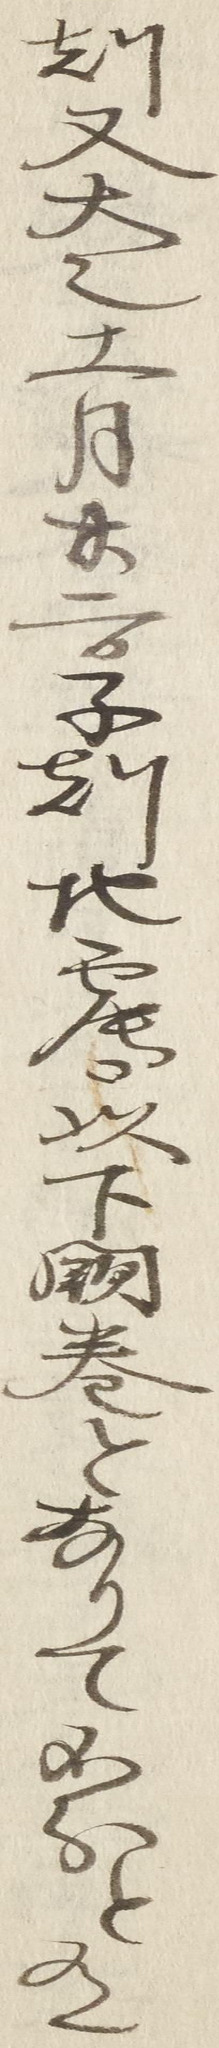刻又大也十一月廿二日酉子刻地震〇以下闕巻となりて不分と有
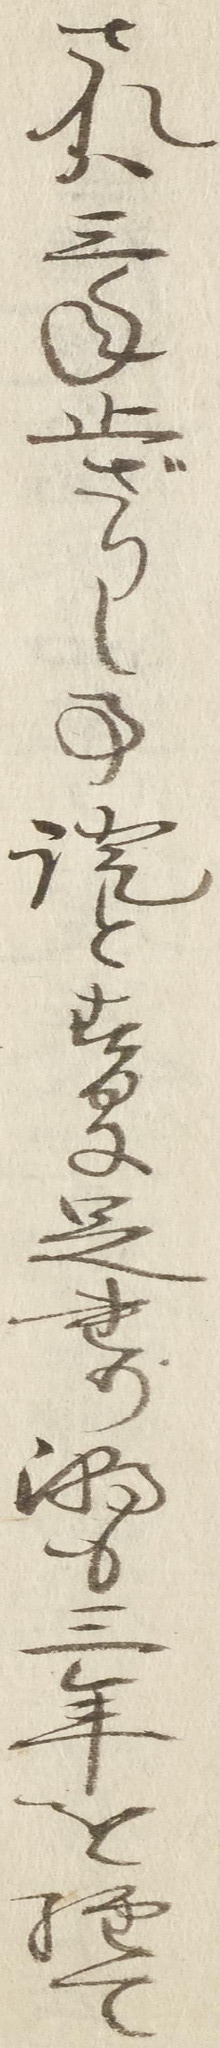されは三年止むざりし事證とするに足れり潮も三年を経て
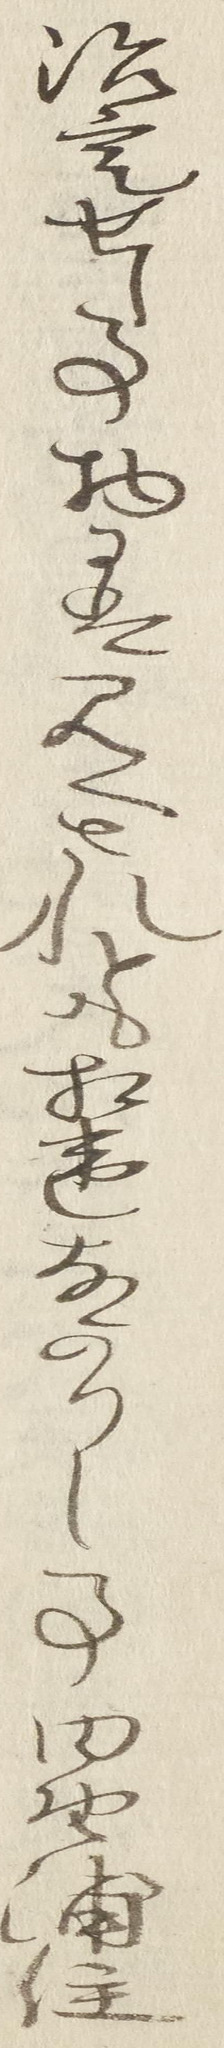治定せし事物には見へされとも相違なかりし事田野浦住
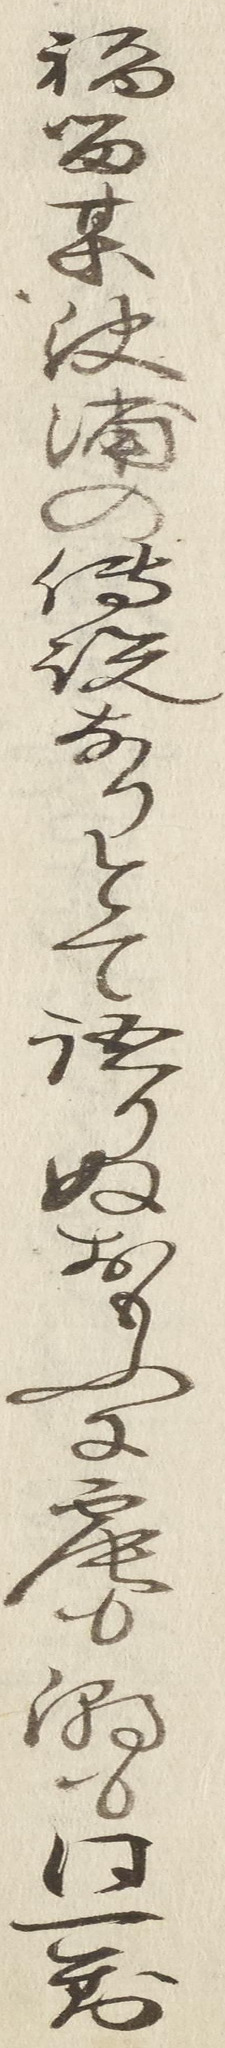福留某波浦の伝説なりとて語りぬおもふに震も潮も同一萬
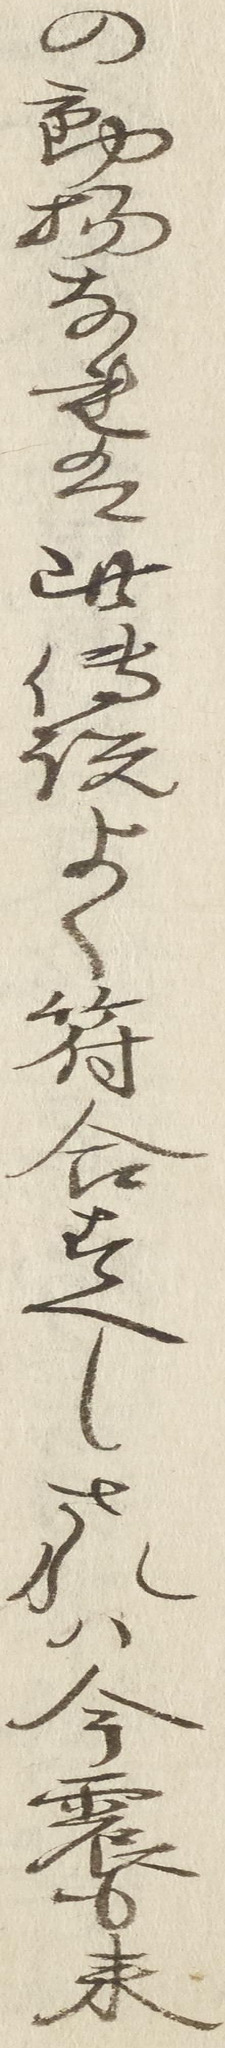の動物なれは此伝説よく符号すへしされは今震も来
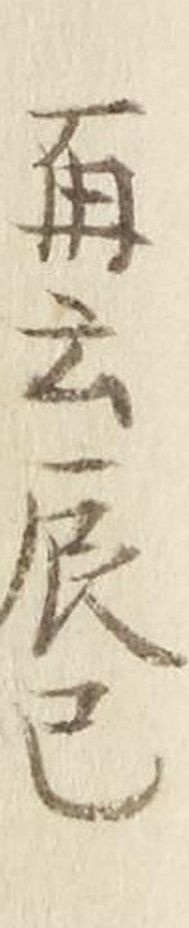再云辰巳
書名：地震記　上
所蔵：東京大学地震研究所図書室 Earthquake Research Institute Library, The University of Tokyo, JAPAN
